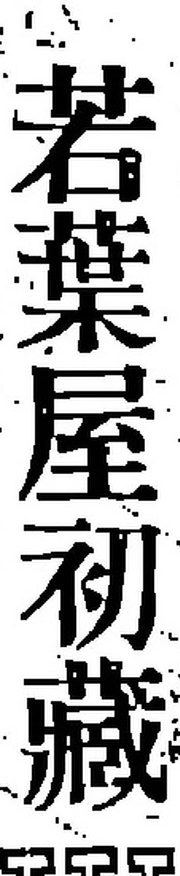若葉屋初蔵
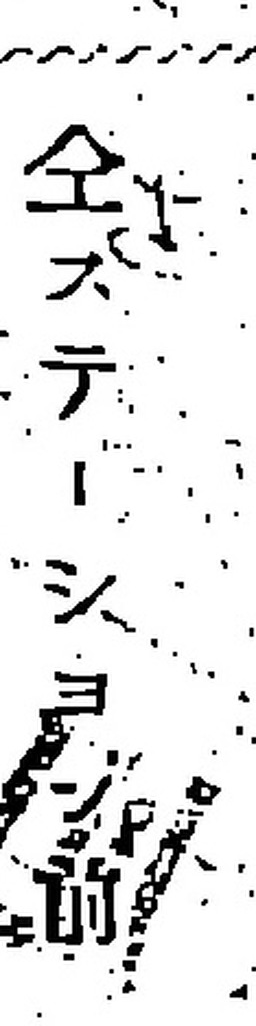仝ステーション前
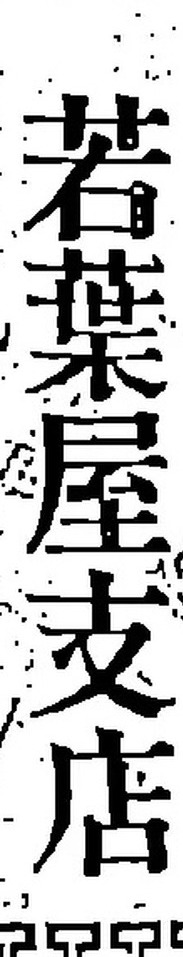若葉屋支店
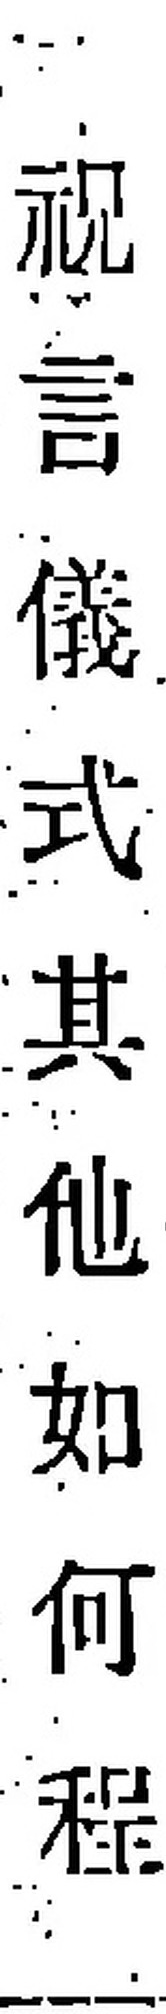祝言儀式其他如何程
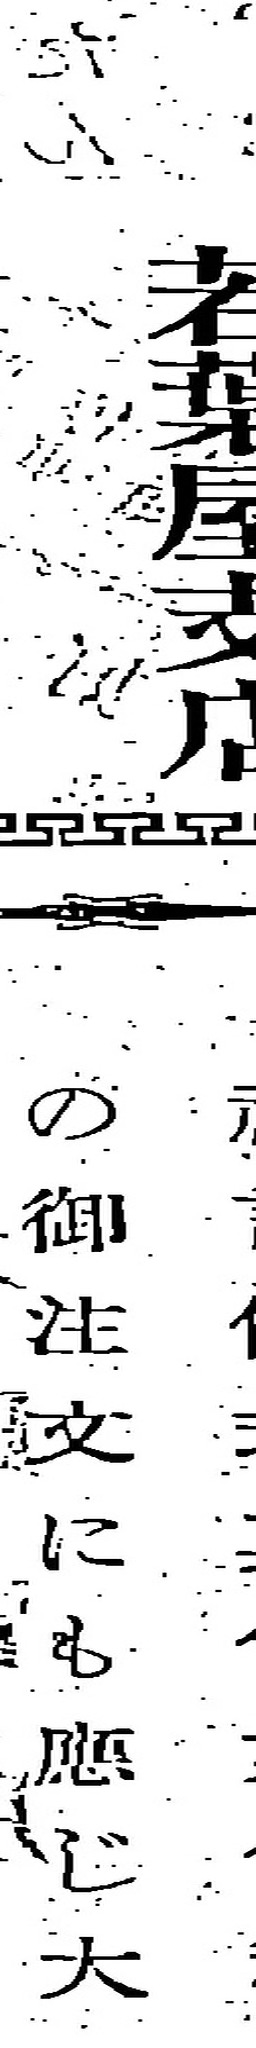の御注文にも応じ大
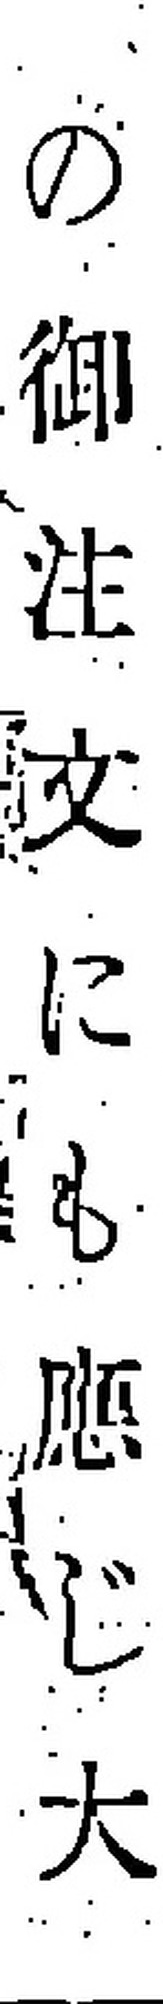の御注文にも応じ大
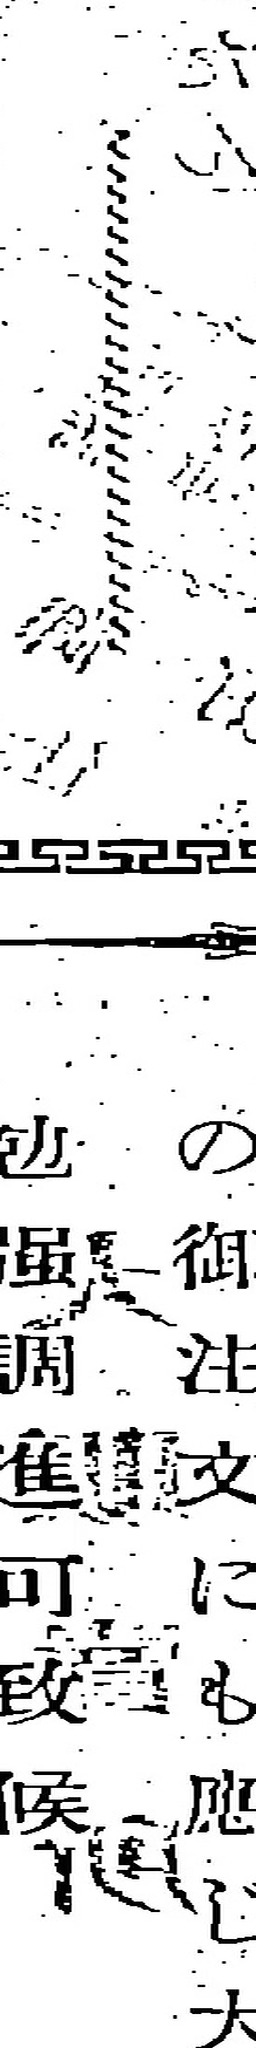勉強調進可致候
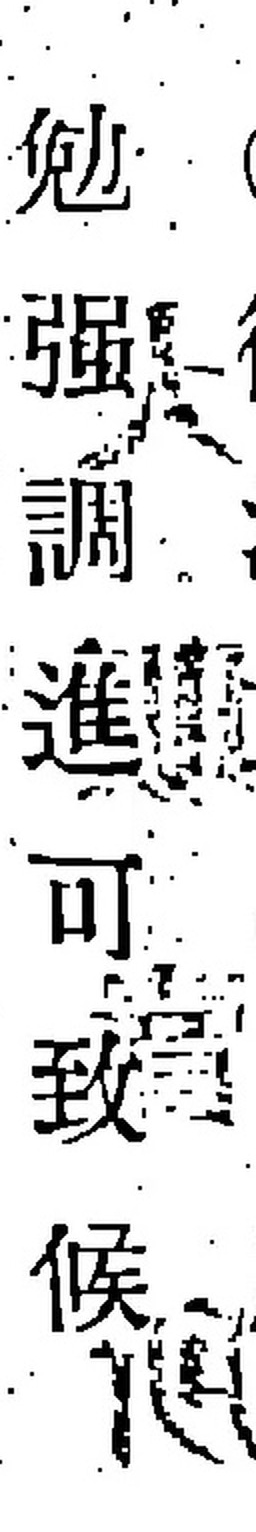勉強調進可致候
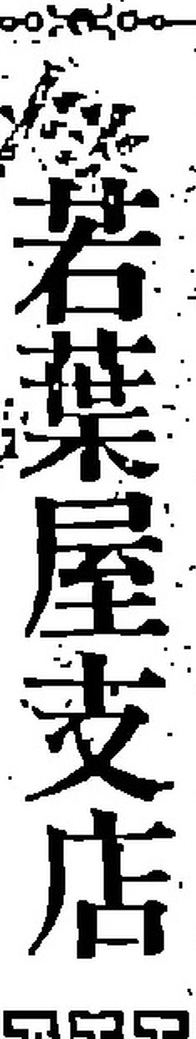若葉屋支店
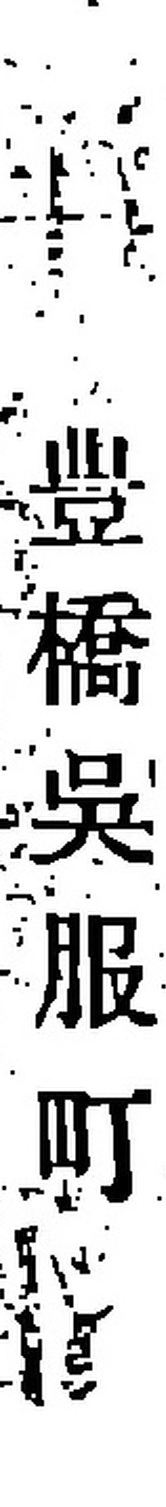豊橋呉服町
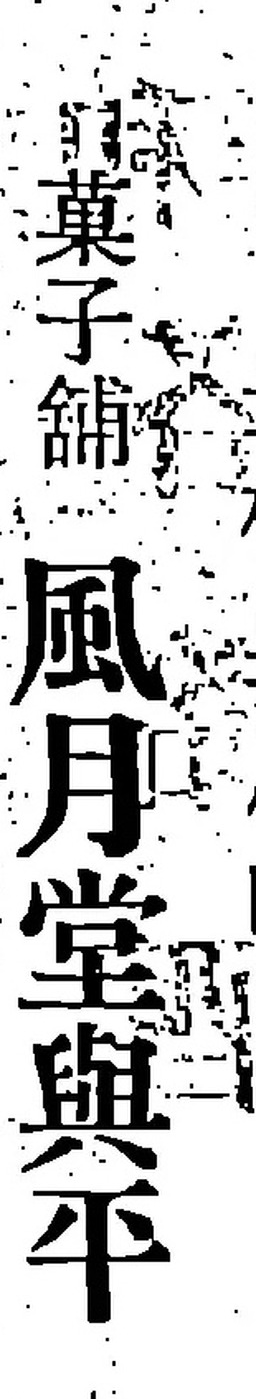菓子舗風月堂与平

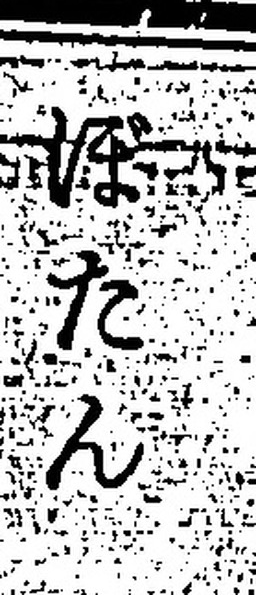ぼたん
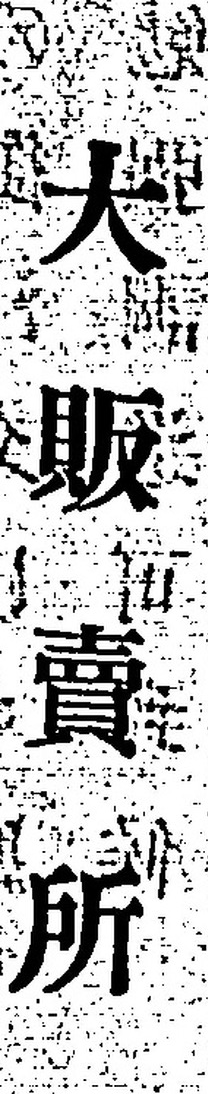大販売所
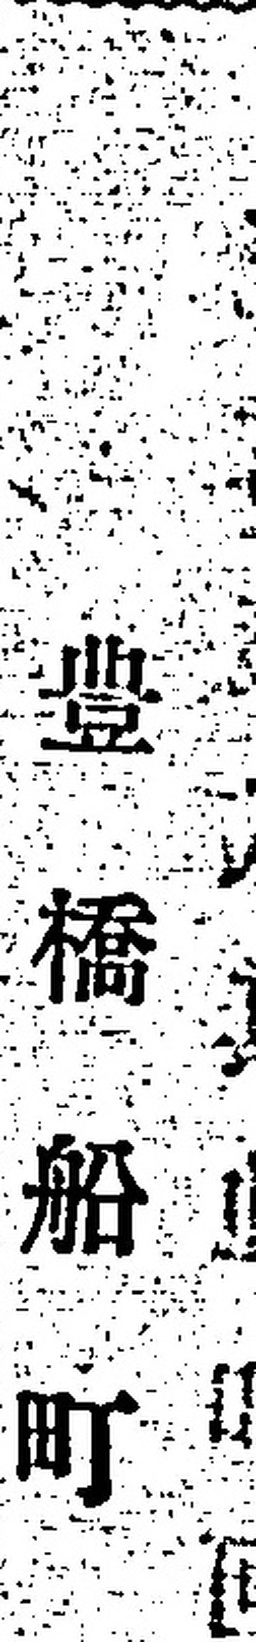豊橋船町
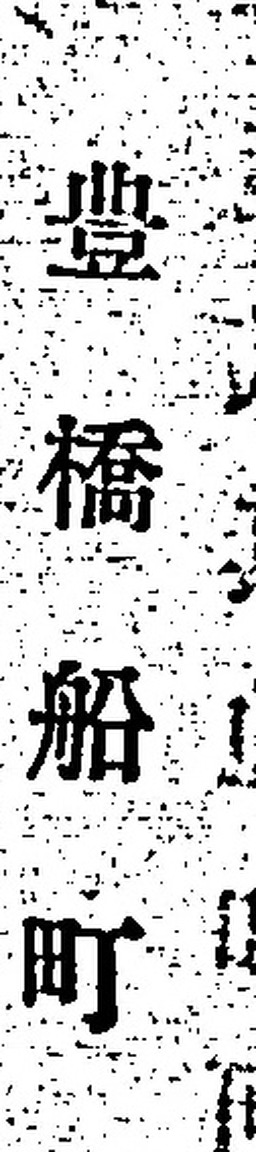豊橋船町
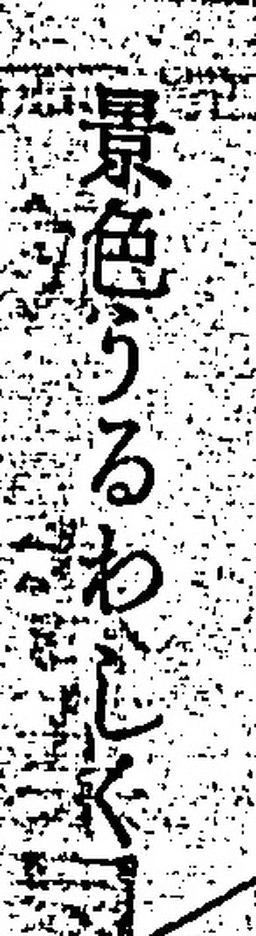景色うるわし
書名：東参名勝案内
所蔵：国立国会図書館 National Diet Library, JAPAN
